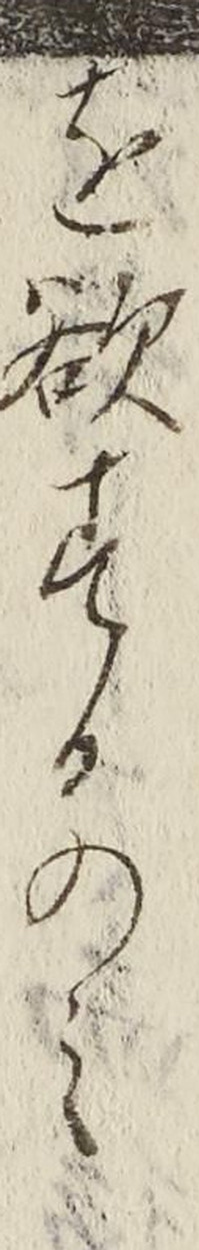を欲するのミ
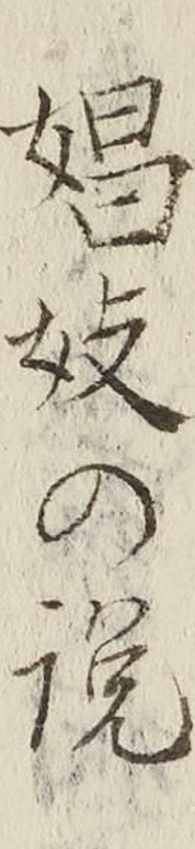娼妓の説
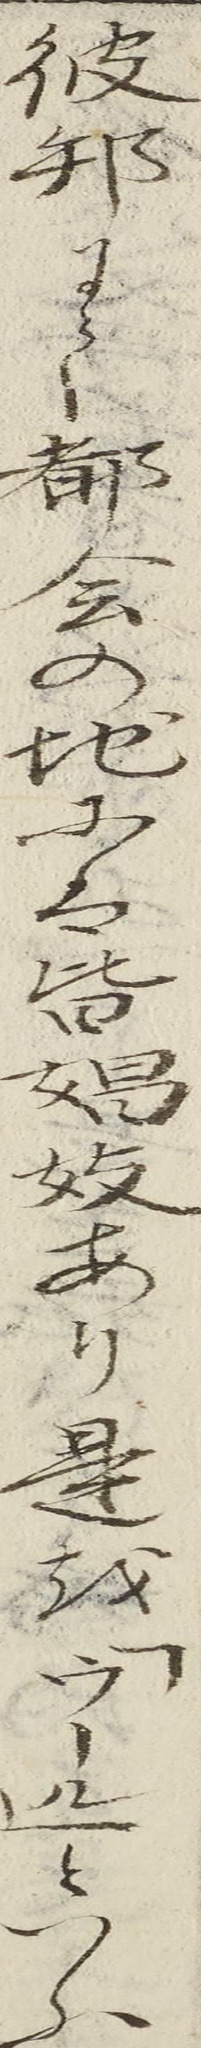彼国にて都会の地には皆娼妓あり是を「ウール」といふ
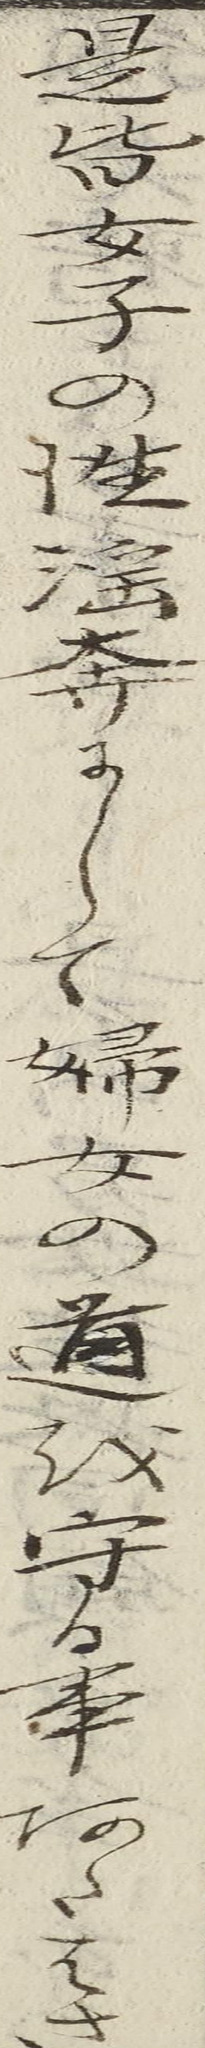是皆女子の性淫奔にして婦女の道を守る事あたはさ
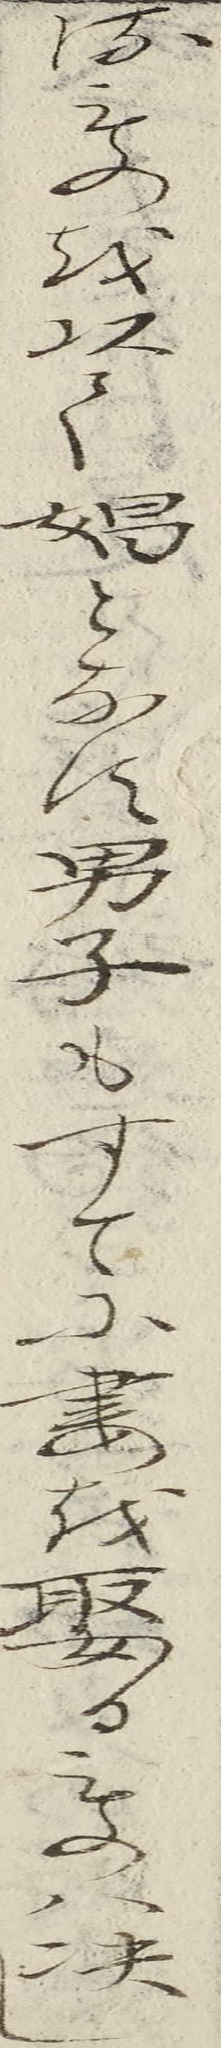るもの以て娼となす男子もすてに妻を娶るものハ決し
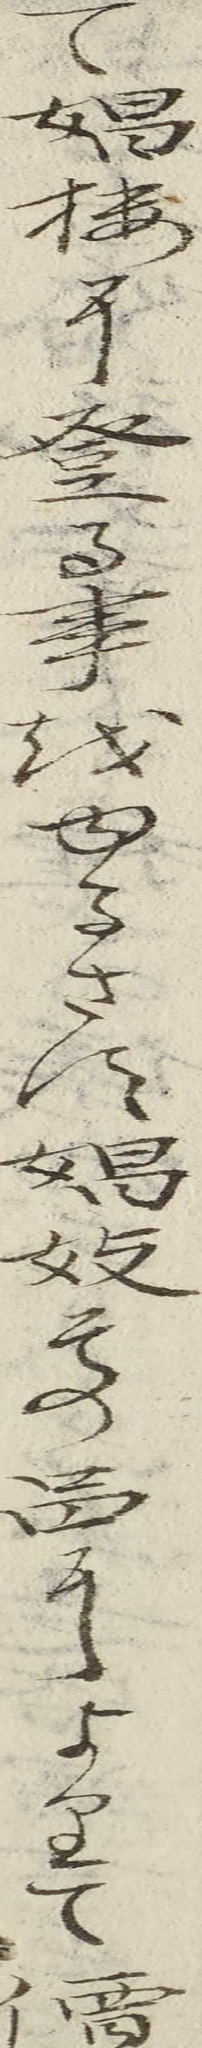て娼楼に登ることをゆるさす娼妓その品によりて價
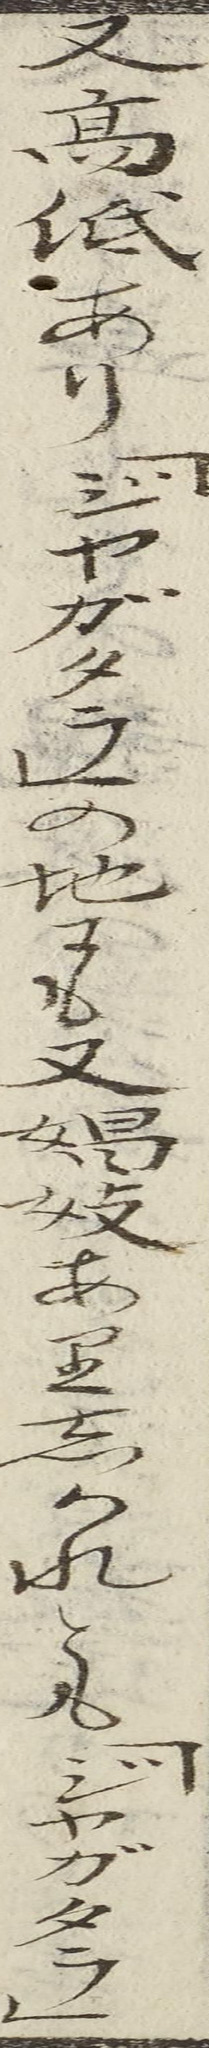又高低あり「ジャガタラ」の地にも亦娼妓ありしかれとも「ジャガタラ」
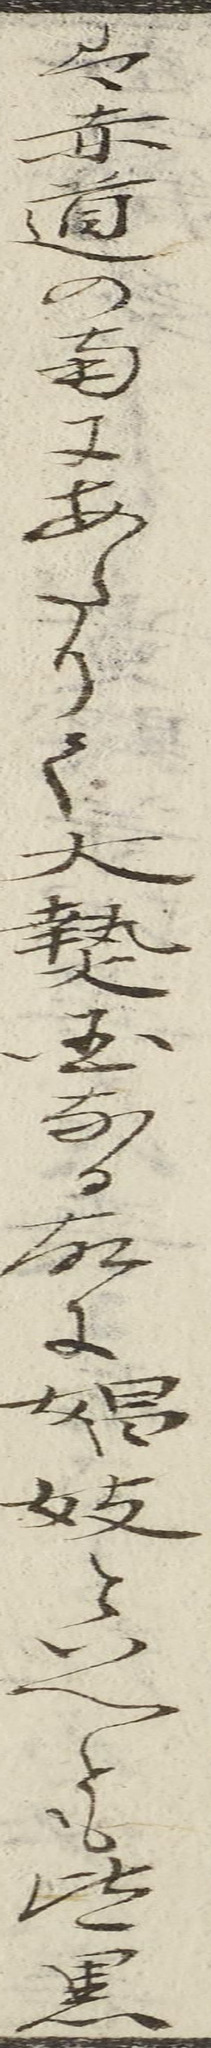は赤道の南にあたりて大熱国なる故に娼妓といへとも皆黒
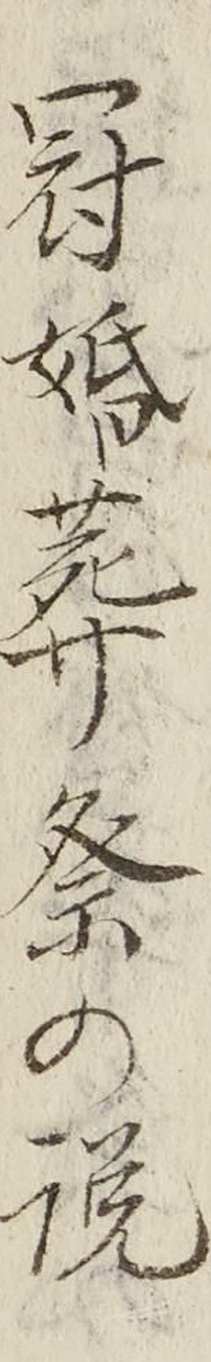冠婚葬祭の説

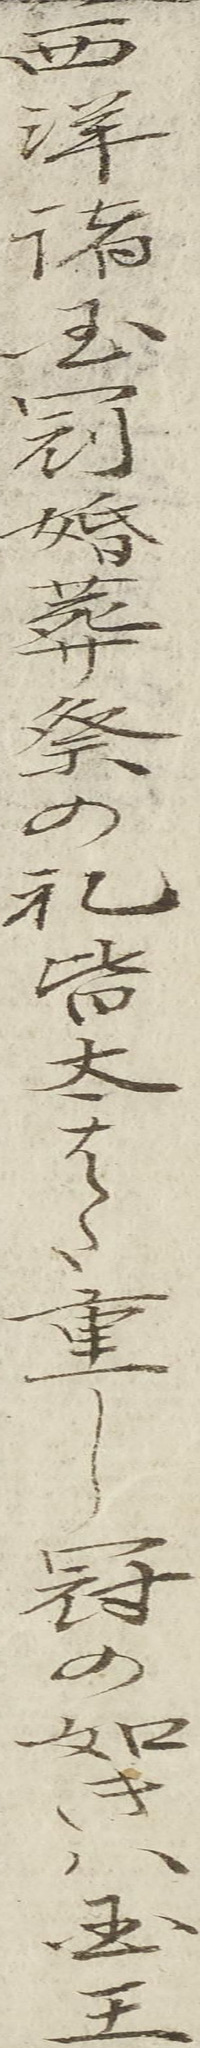西洋諸国冠婚葬祭の礼皆大はた重し冠の如きハ国王
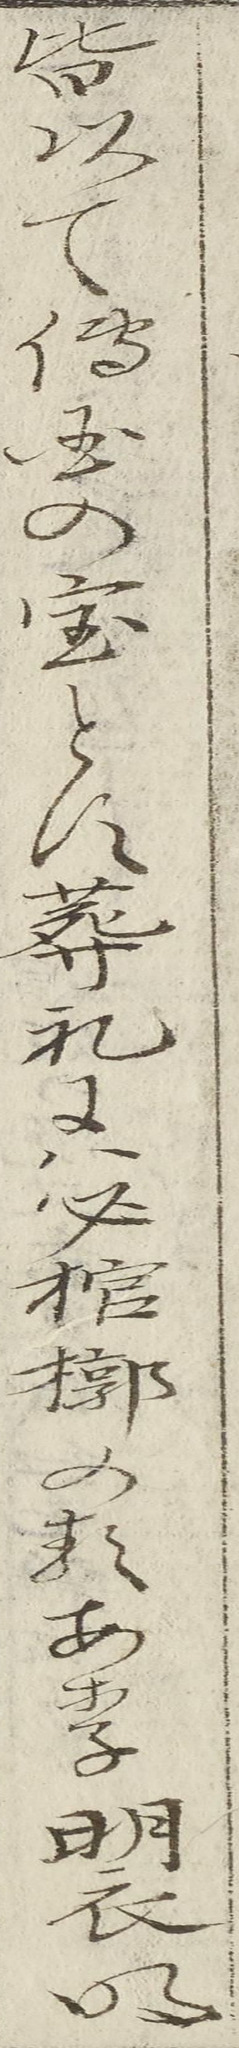皆以て伝国の宝とす葬礼にハ必棺槨の類あり明衣明
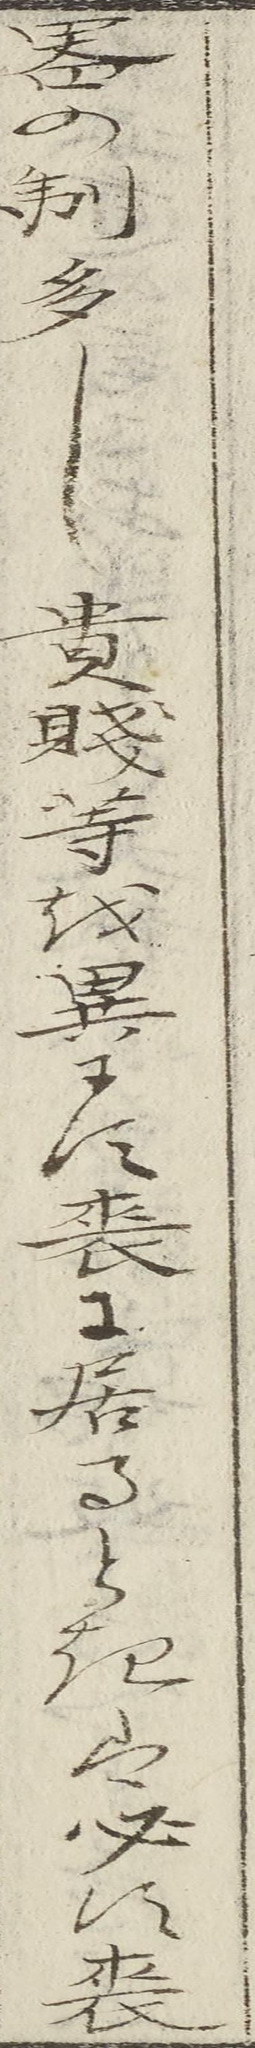器の制多し貴賤等を異にす喪に居るときは必す喪
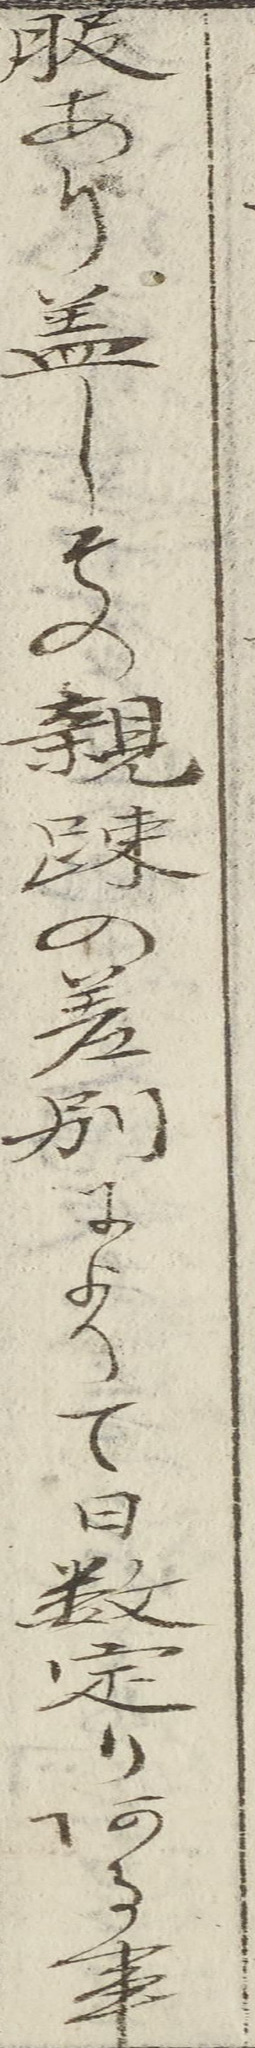服あり蓋しその親疎の差別によりて日数定りある事
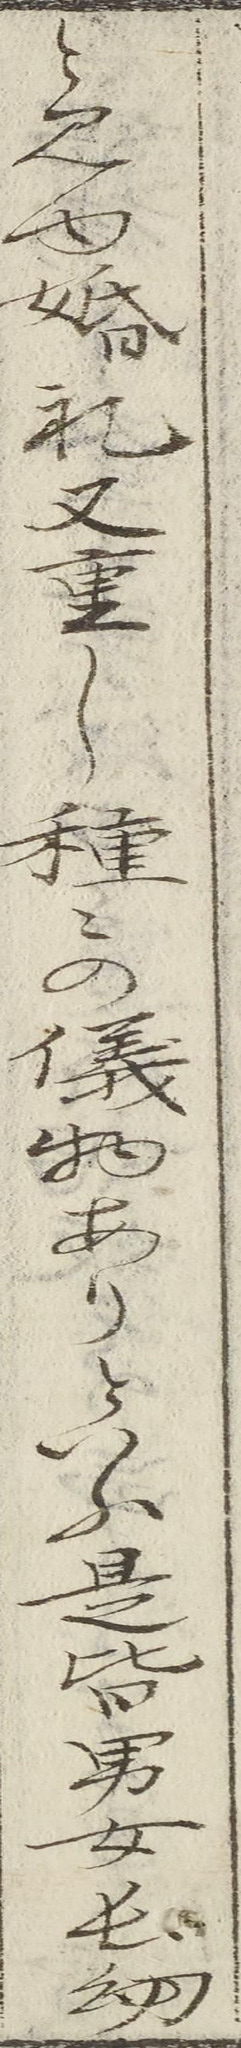とみゆ婚礼又重し種々の儀物ありといふ是皆男女長幼
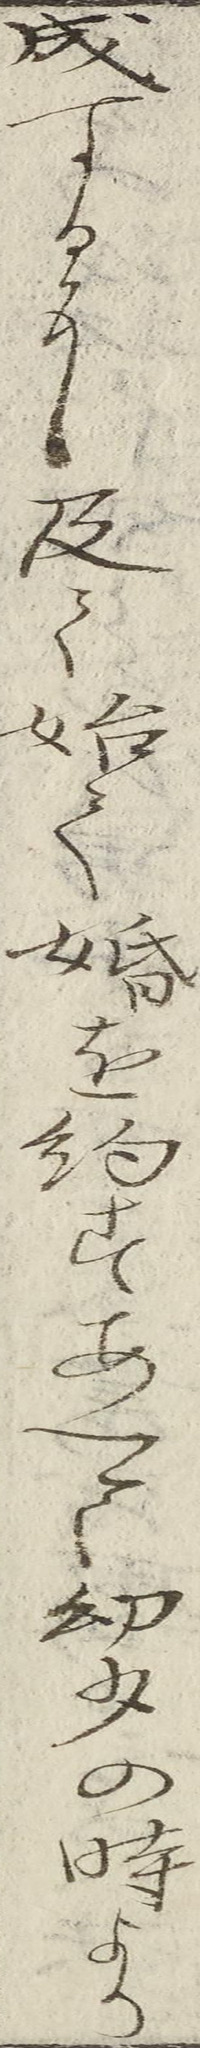成するに及て始て婚を約すあへて幼少の時より
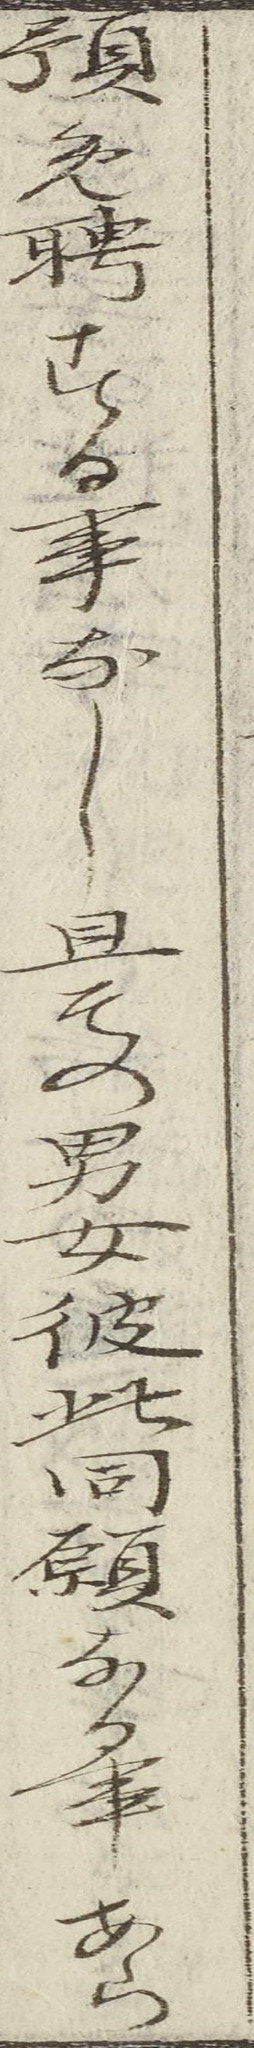預め聘する事なし且その男女彼此同願なる事あら
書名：西洋雜記　坤
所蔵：東京大学地震研究所図書室 Earthquake Research Institute Library, The University of Tokyo, JAPAN
